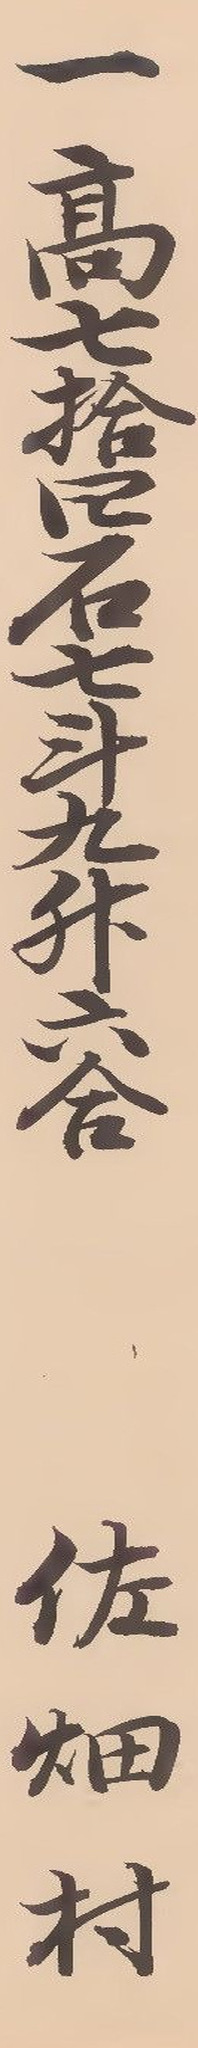一高七拾四石七斗九升六合佐畑村
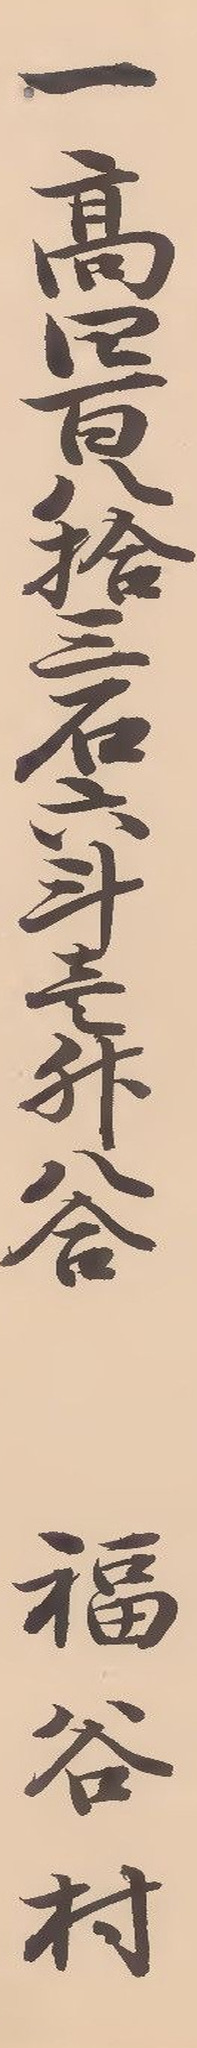一高四百八拾三石六斗壱升八合福谷村
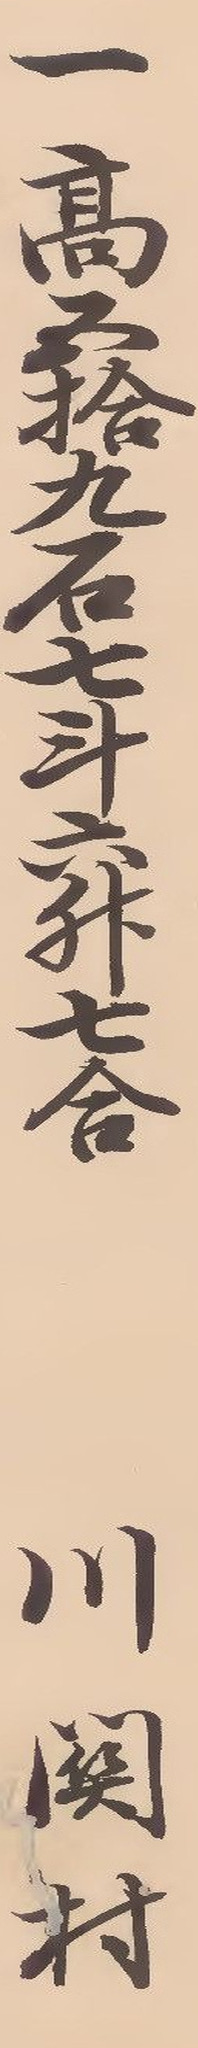一高五拾九石七斗六升七合川関村
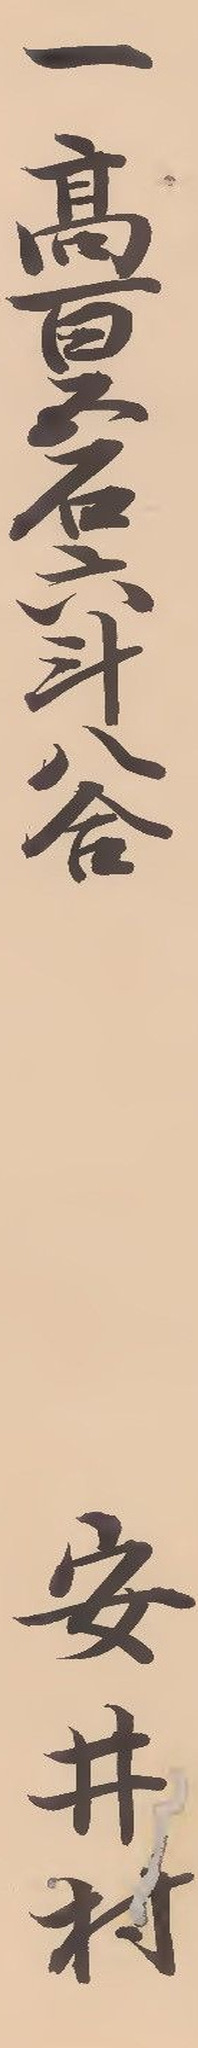一高百五石六斗八合安井村
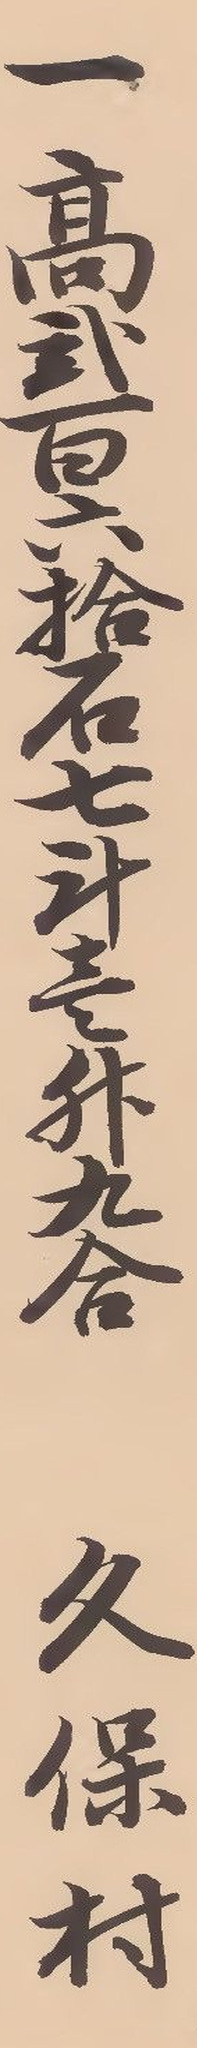一高弐百六拾石七斗壱升九合久保村
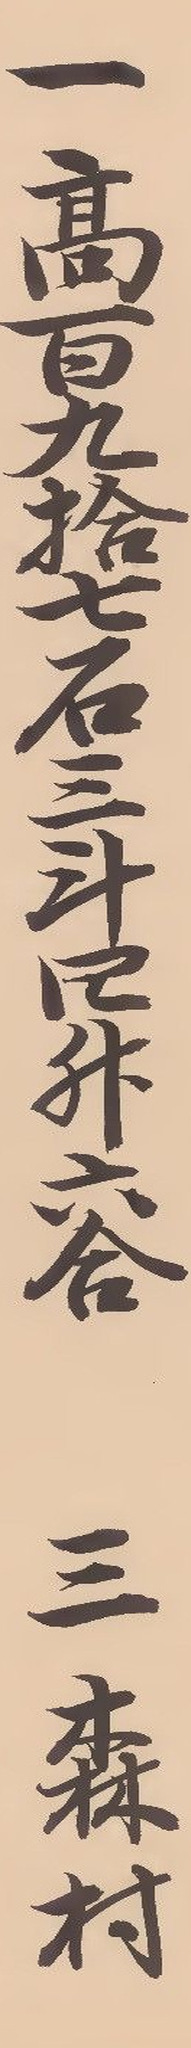一高百九拾七石三斗四升六合三森村
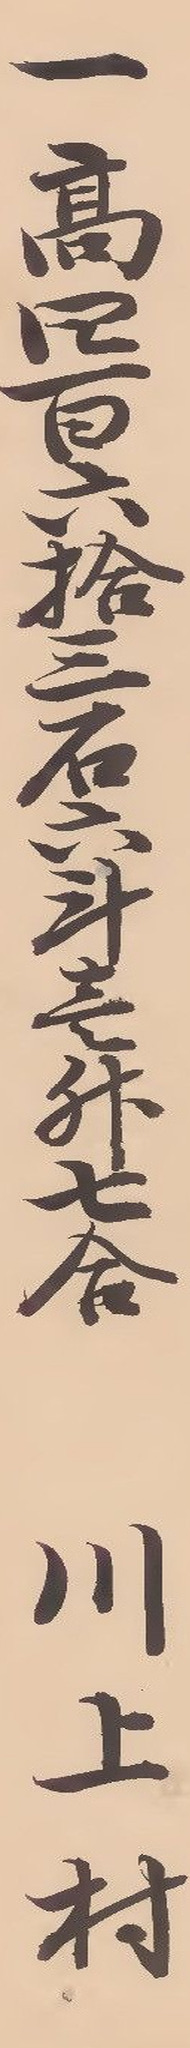一高四百六拾三石六斗壱升七合川上村

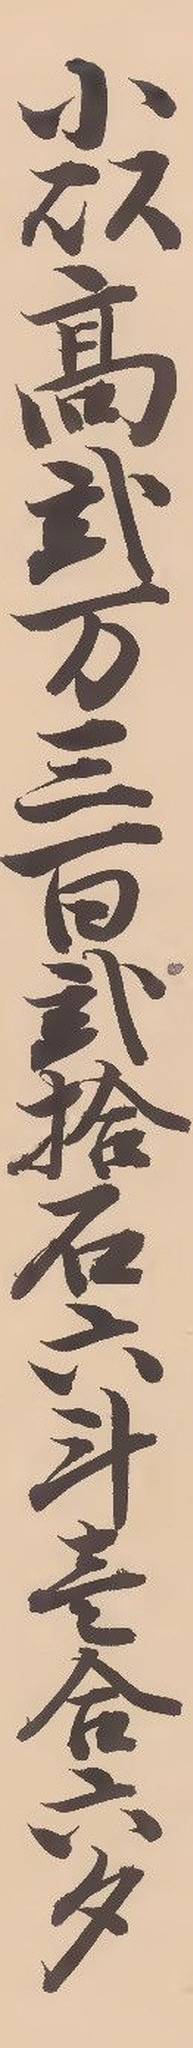小以高弐万三百弐拾石六斗壱合六勺
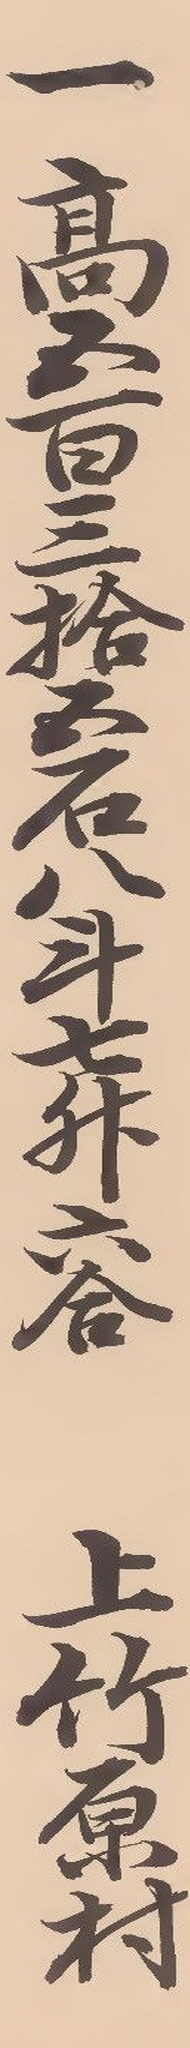一高五百三拾五石八斗七升六合上竹原村
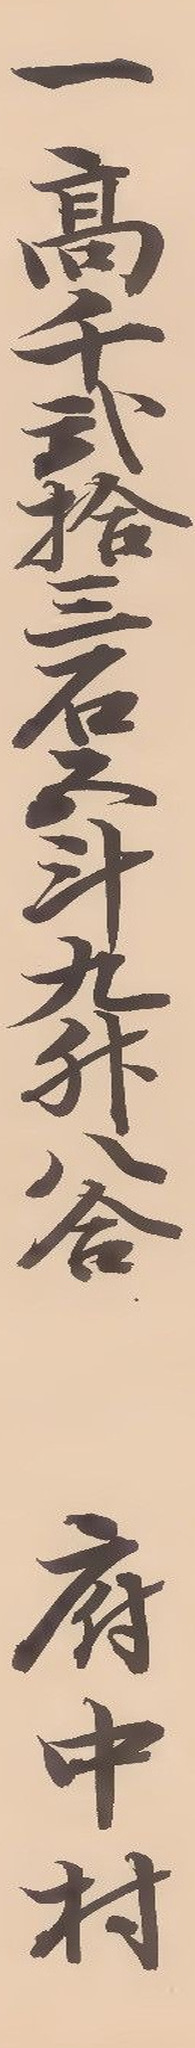一高千弐拾三石五斗九升八合府中村
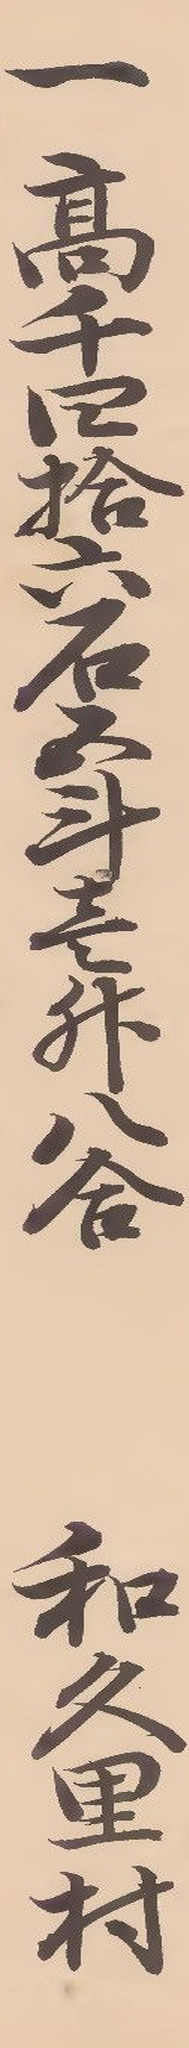一高千四拾六石五斗壱升八合和久里村

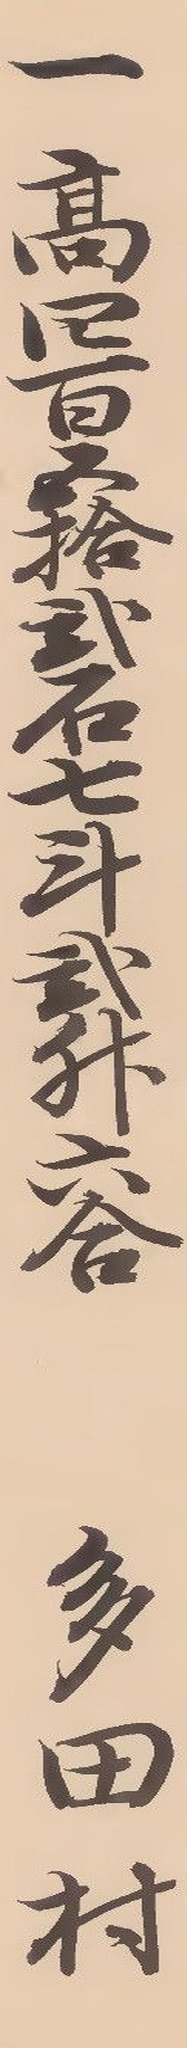一高四百五拾弐石七斗弐升六合多田村
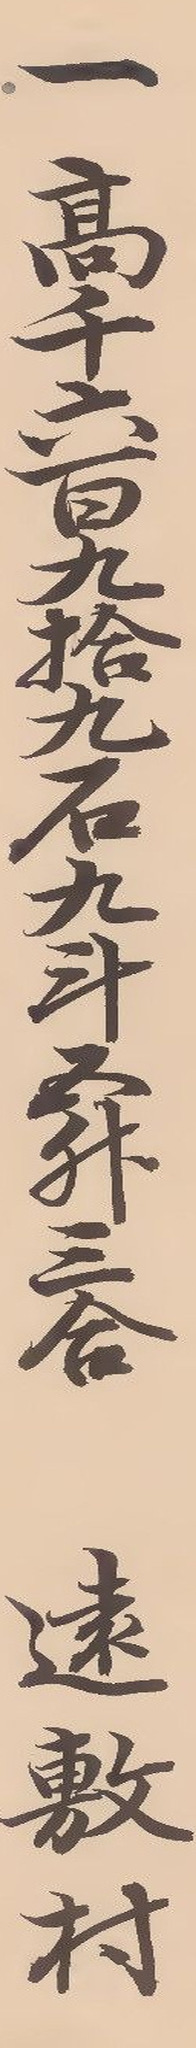一高千六百九拾九石九斗五升三合遠敷村
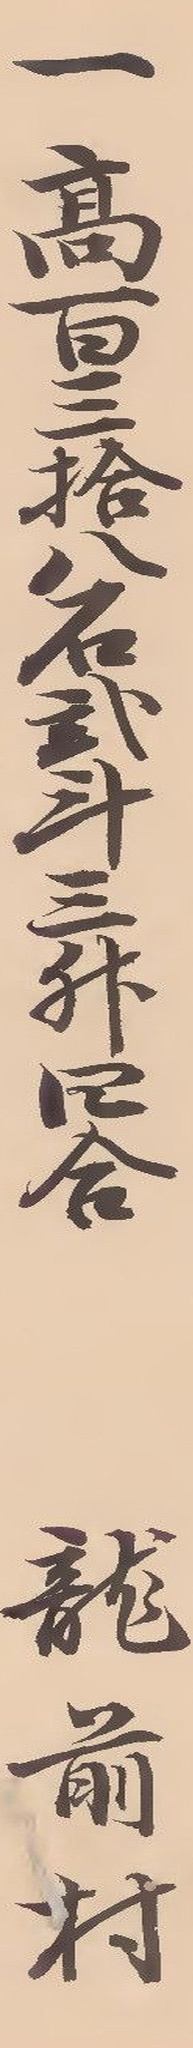一高百三拾八石弐斗三升四合龍前村
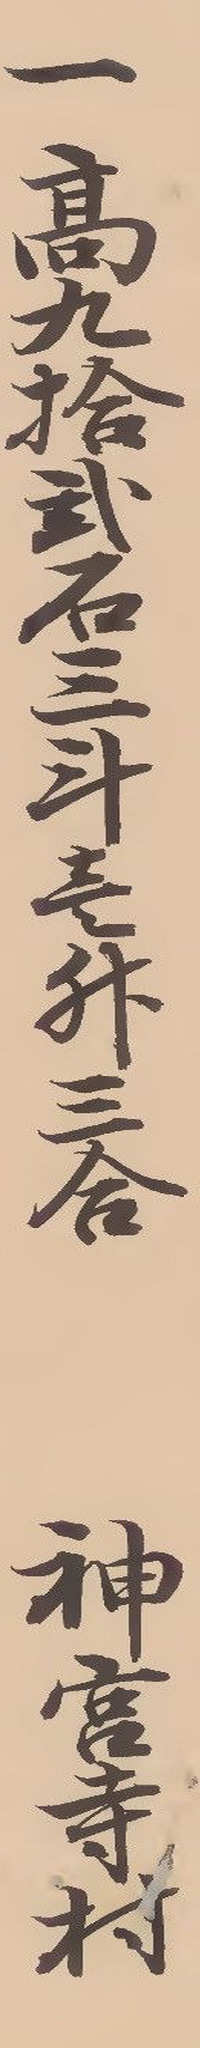一高九拾弐石三斗壱勺三合神宮寺村
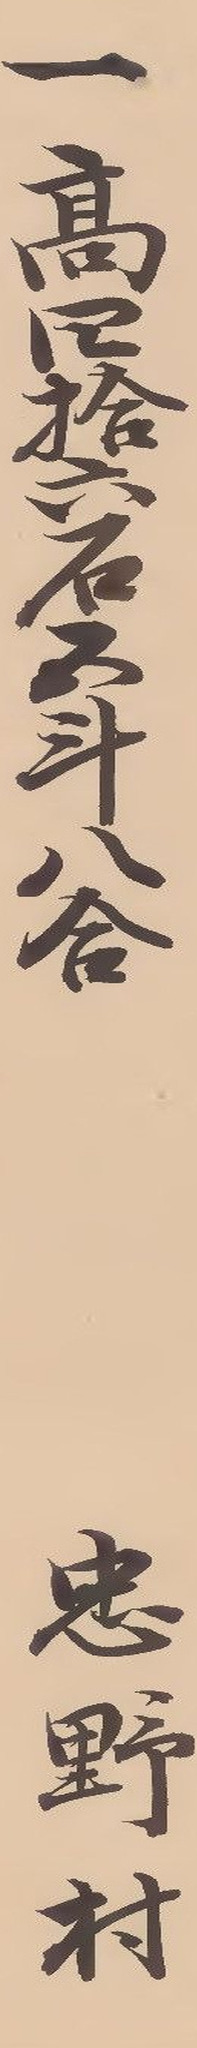一高四拾六石五斗八合忠野村
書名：若狭国郷帳
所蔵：国立公文書館 National Archives of Japan
